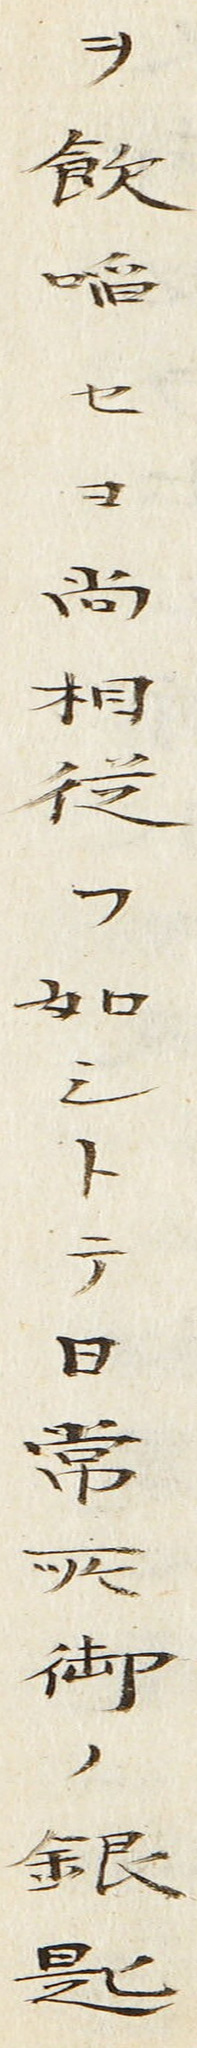ヲ飲㗖セヨ尚相従フ如シトテ日常所御ノ銀匙
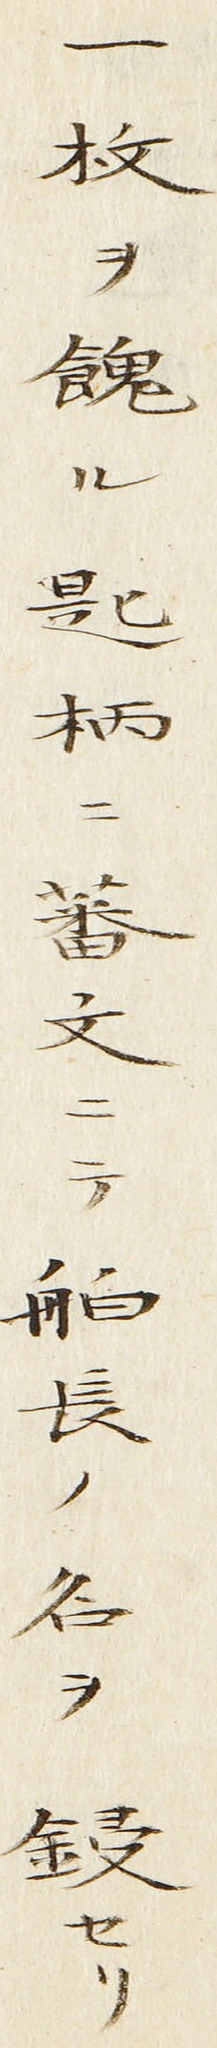一枚ヲ餽ル匙柄ニ蕃文ニテ舶長ノ名ヲ鋟セリ
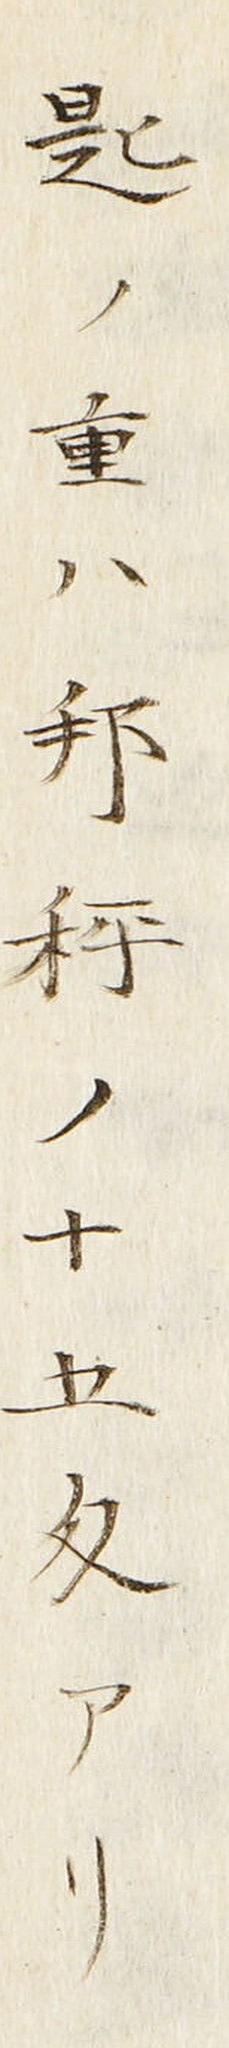匙ノ重ハ邦秤ノ十五匁アリ
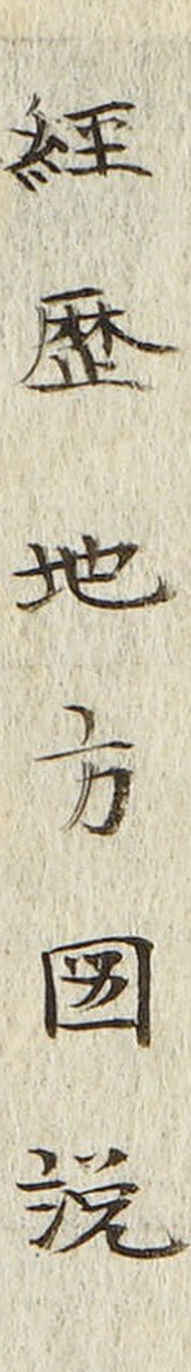径歴地方図説
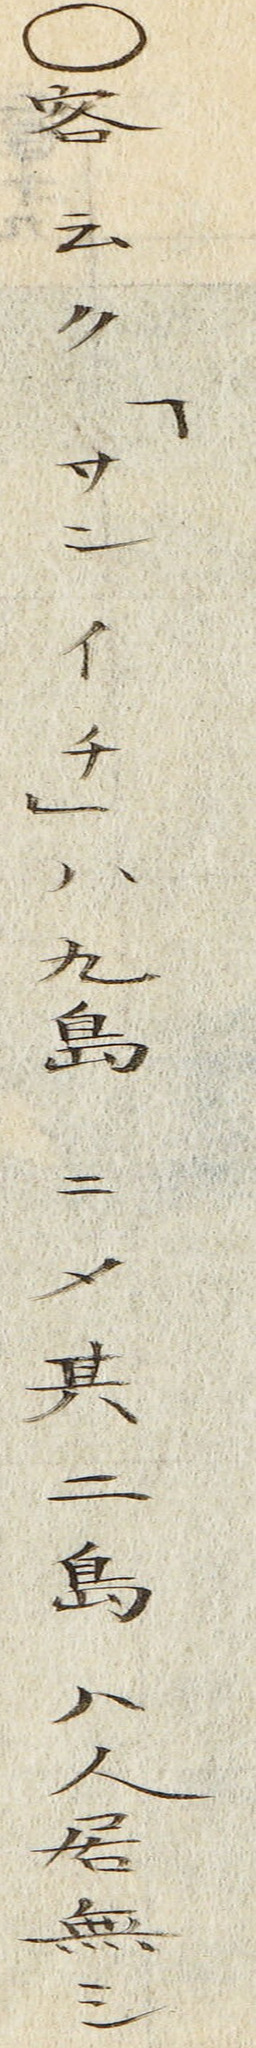○客云ク「サンイチ」ハ九島ニシテ其二島ハ人居無シ
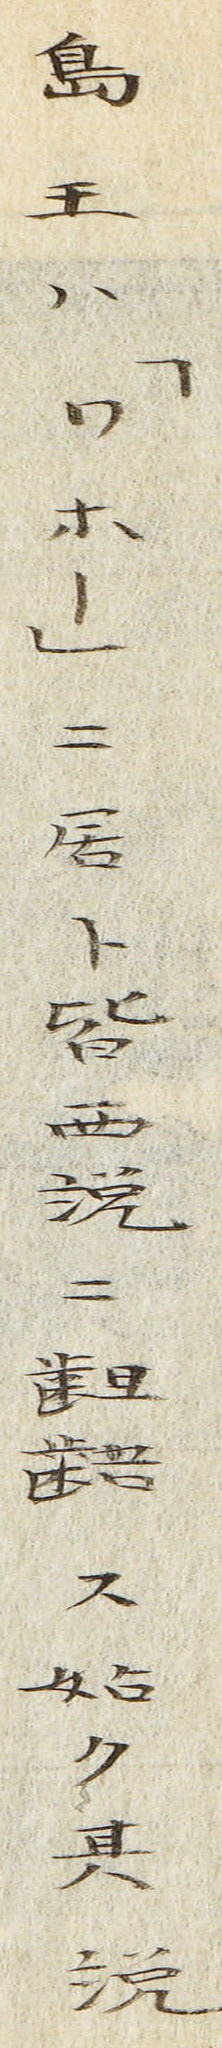島王ハ「ワホー」ニ居ト皆西説ニ齟齬ス如ク其説
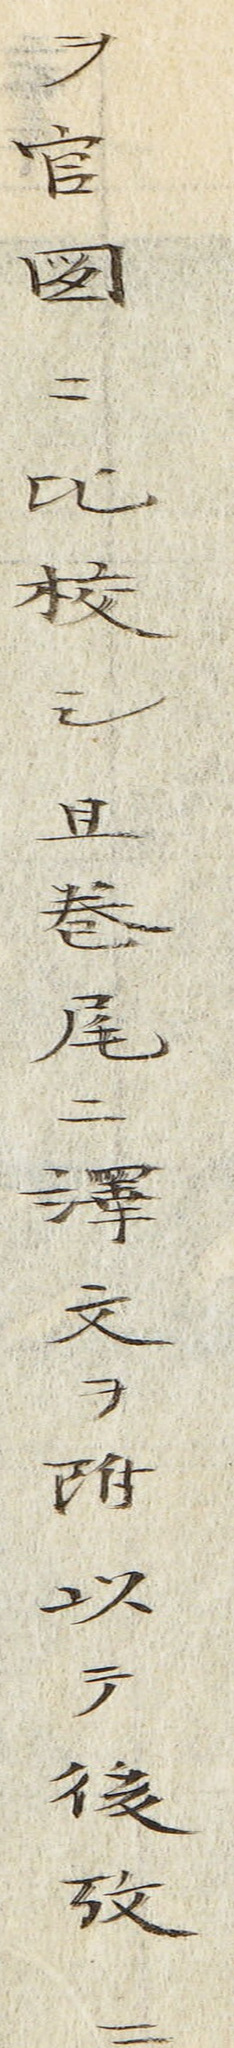ヲ官図ニ比校シ且巻尾ニ譯文ヲ附以テ後攷ニ
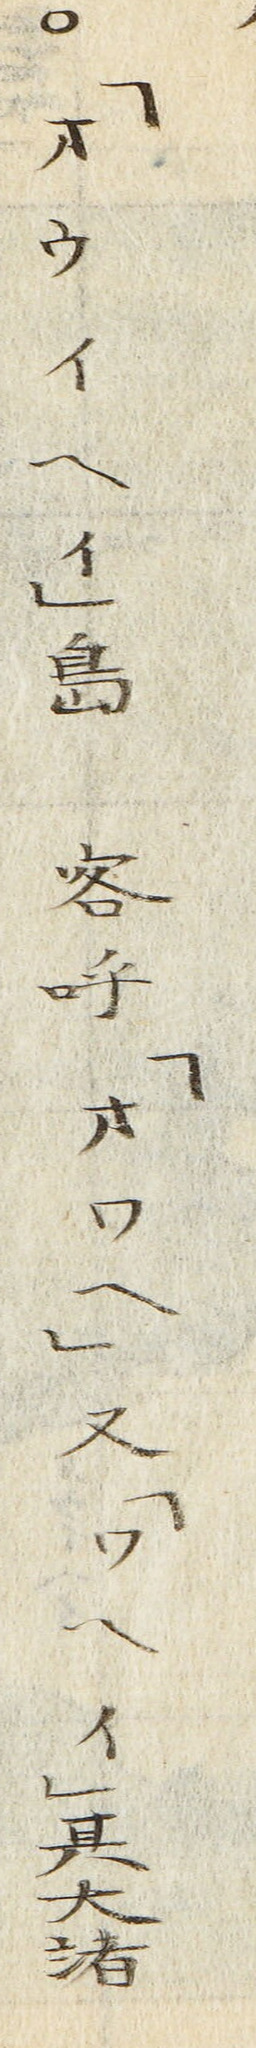◦「オウイヘイ」島客呼「オワヘ」又「ワヘイ」其大諸
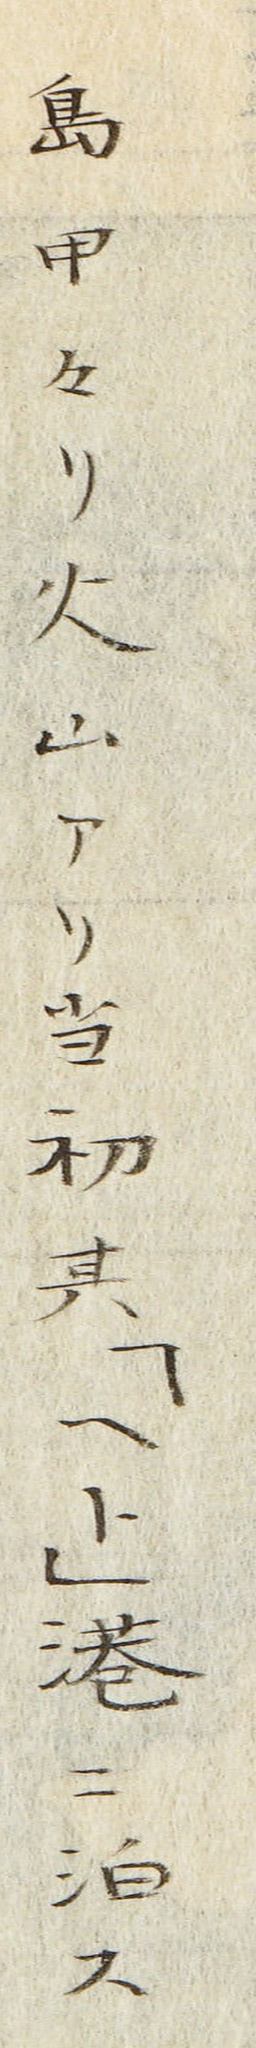島甲々リ火山アリ当初其「ヘト」港ニ泊ス
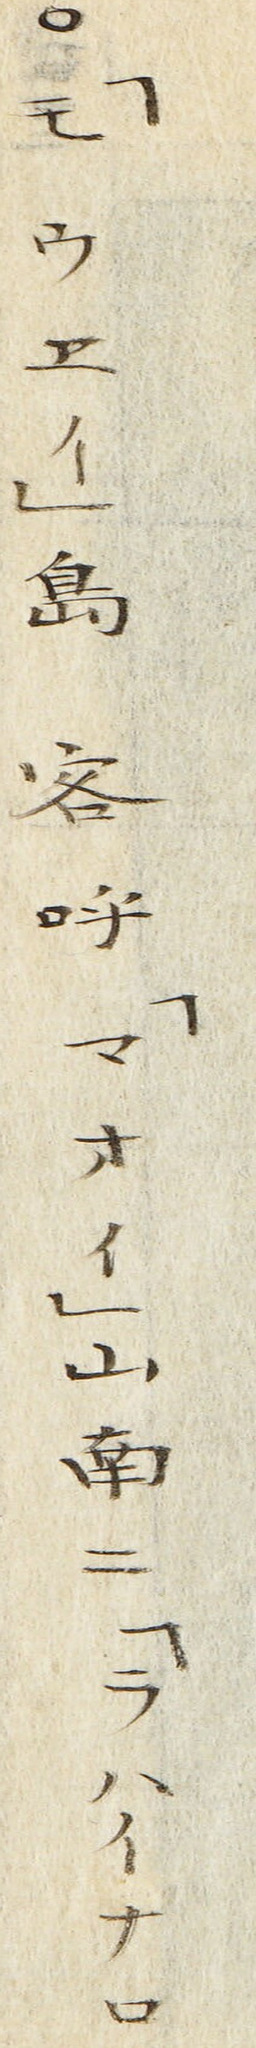◦「モウヱイ」島客呼「マオイ」山南ニ「ラハイナロ
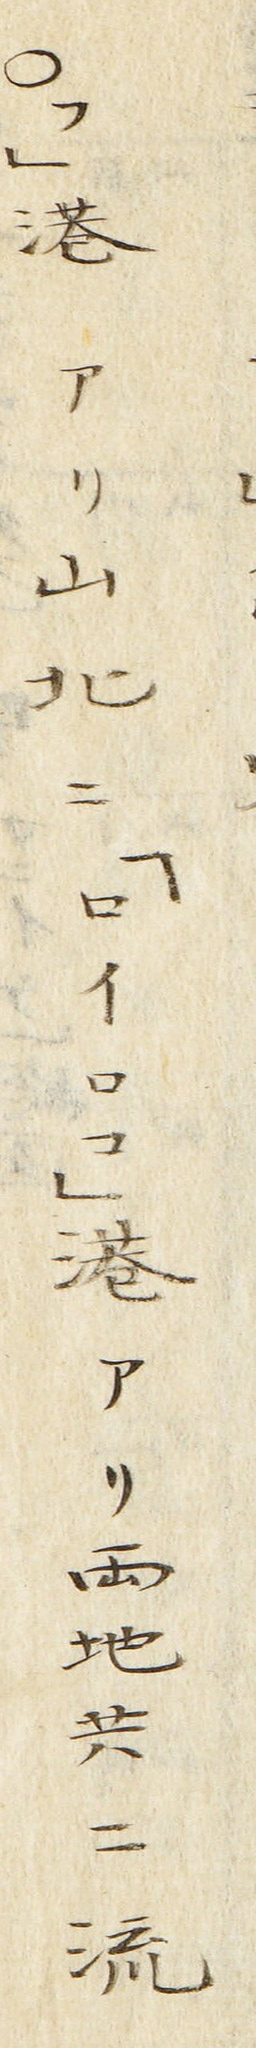○フ」港アリ山北ニ「ロイロコ」港アリ両地共ニ流

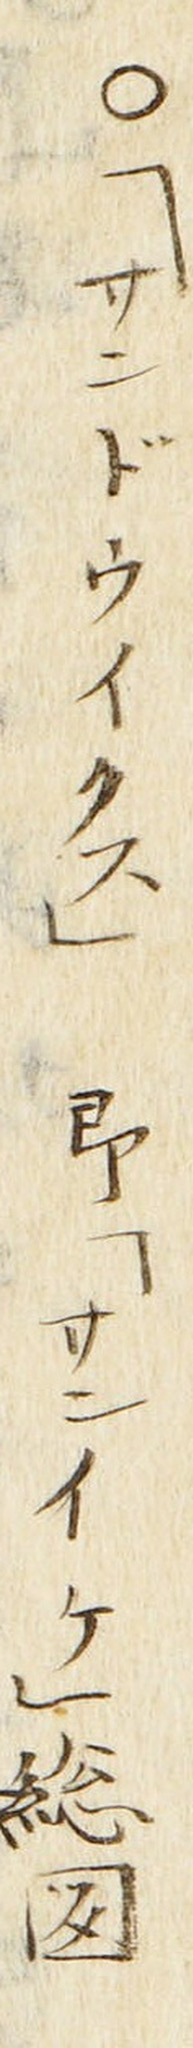○「サンドウイクス」即「サンイケ」総図
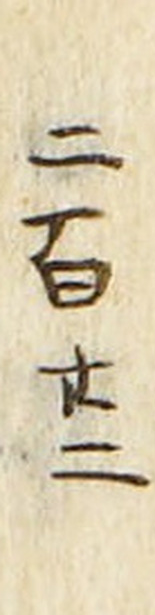二百廿二
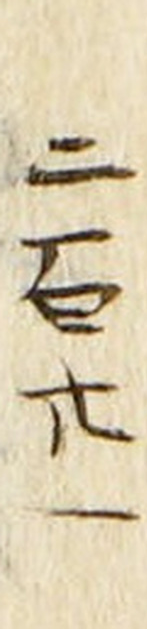二百廿二

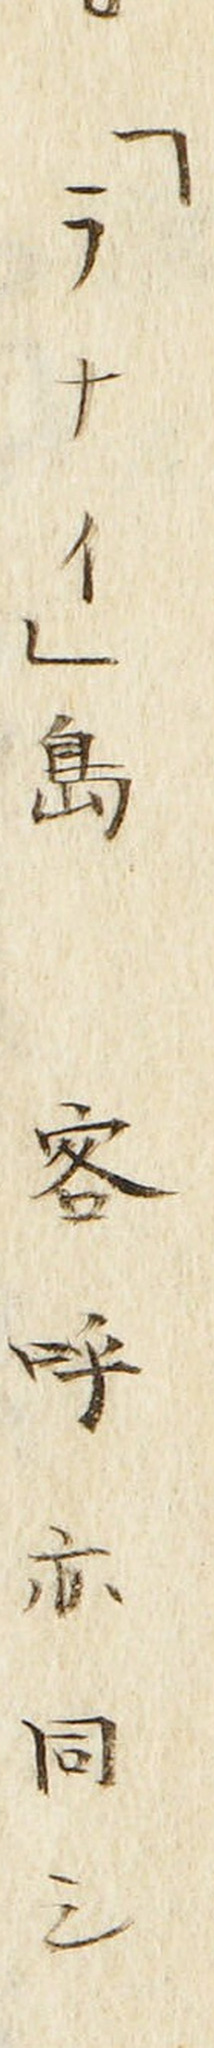◦「ラナイ」島客呼亦同シ
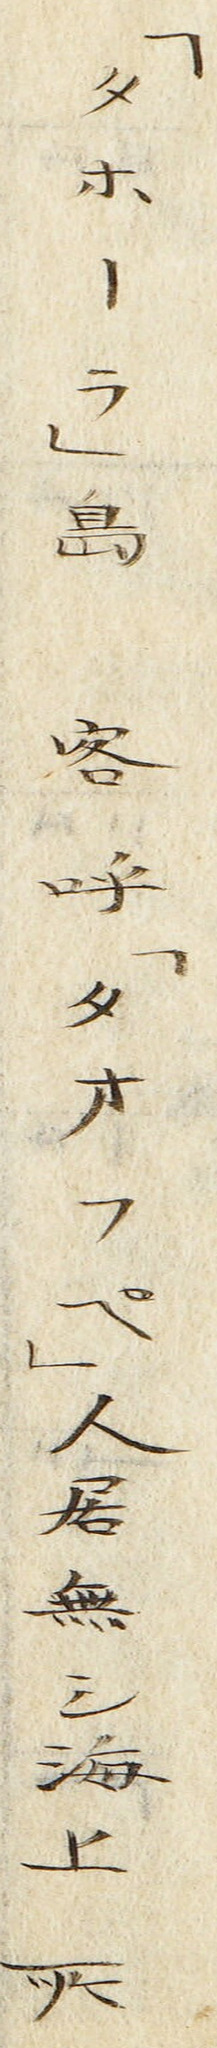「タホーラ」島客呼「タオフペ」人居無シ海上所
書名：流蕃通書
